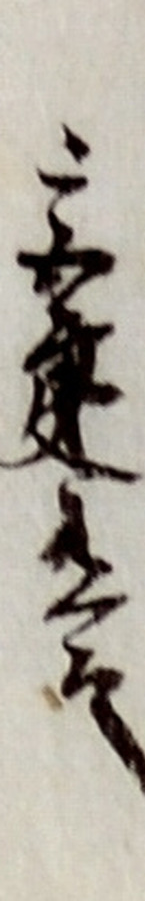宮建有之
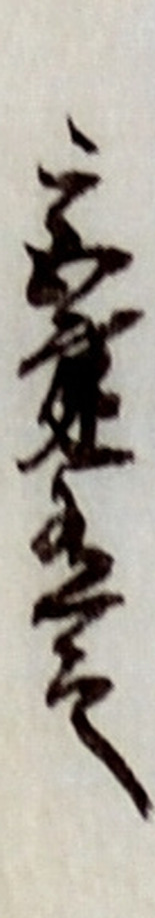宮建有之
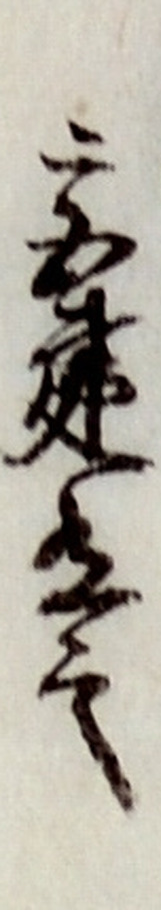宮建有之
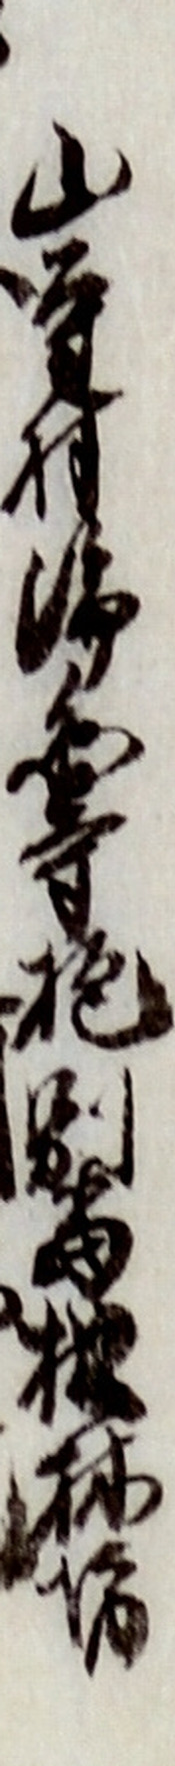山寺村浄円寺抱別当松林坊
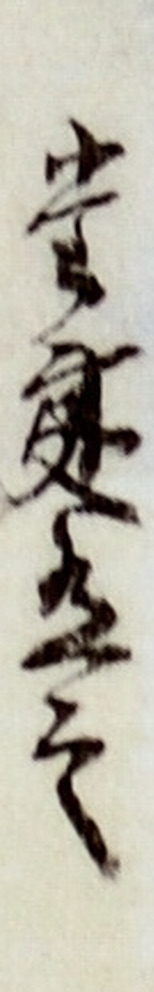宮建有之
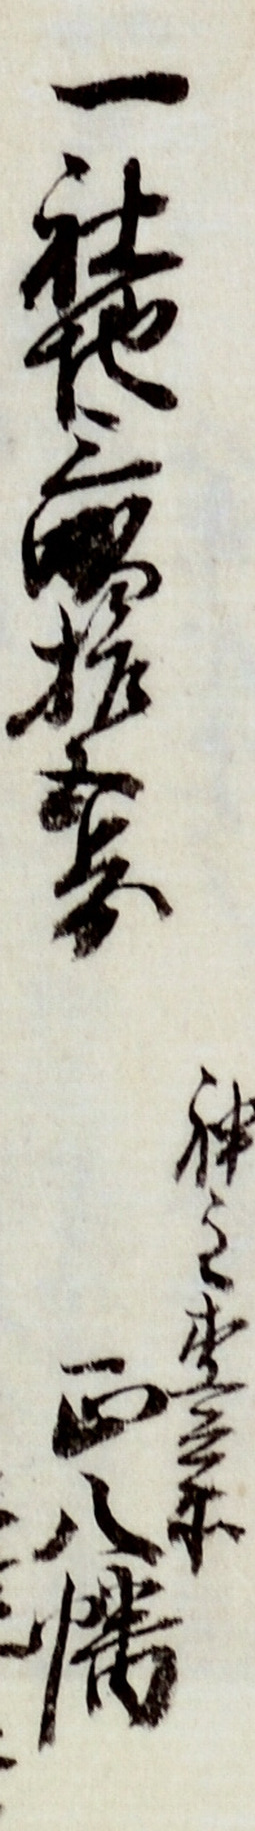一社地三畝拾五歩正八幡
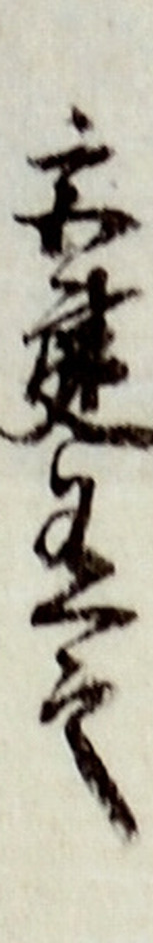宮建有之
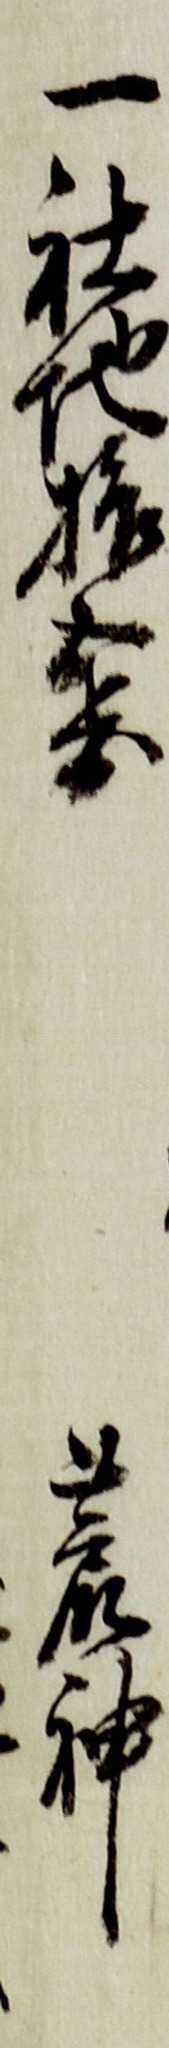一社地拾五歩荒神
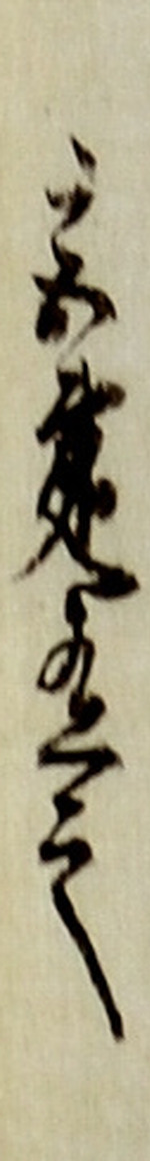宮建有之
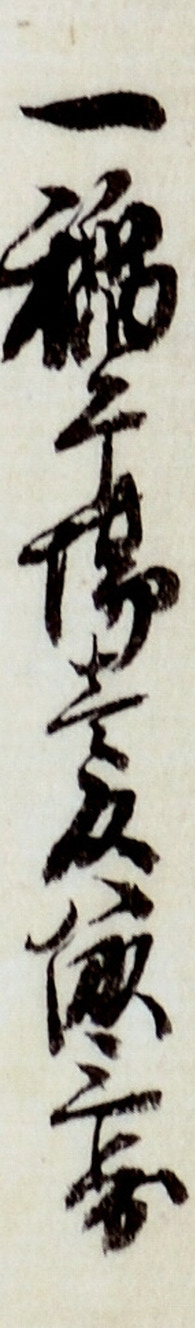一稲干場壱反八畝三歩
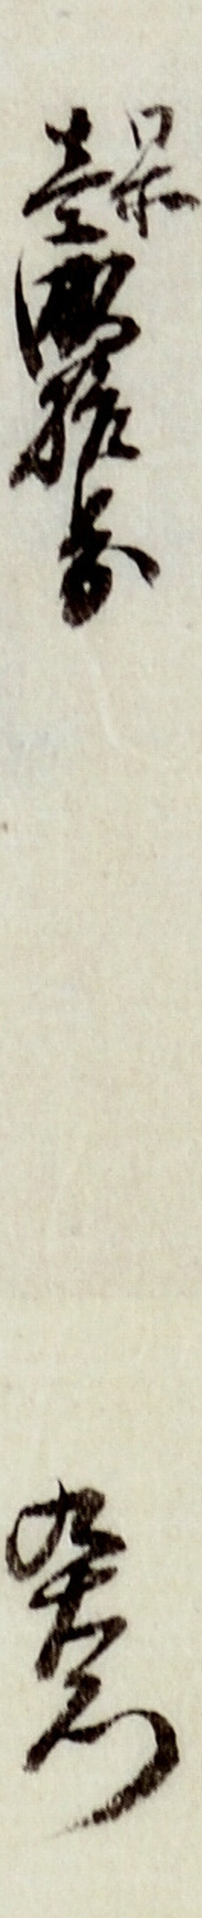壱畝拾歩九右衛門
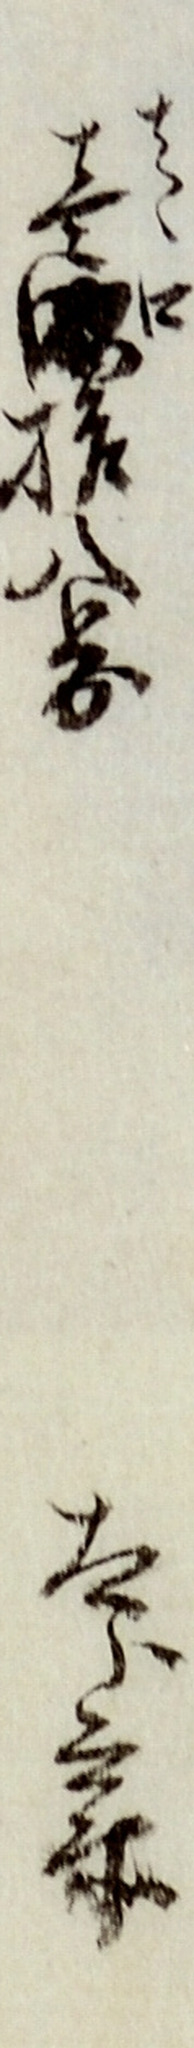壱畝拾八歩太郎兵衛
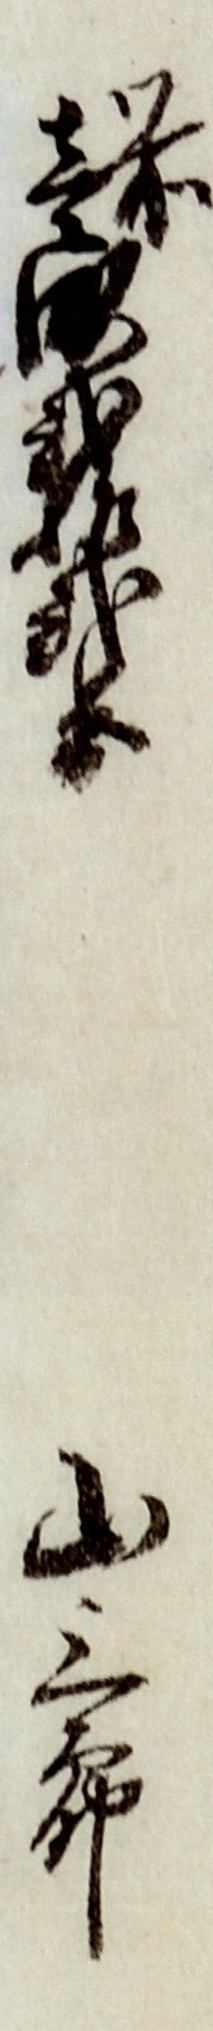壱畝弐拾弐歩山三郎
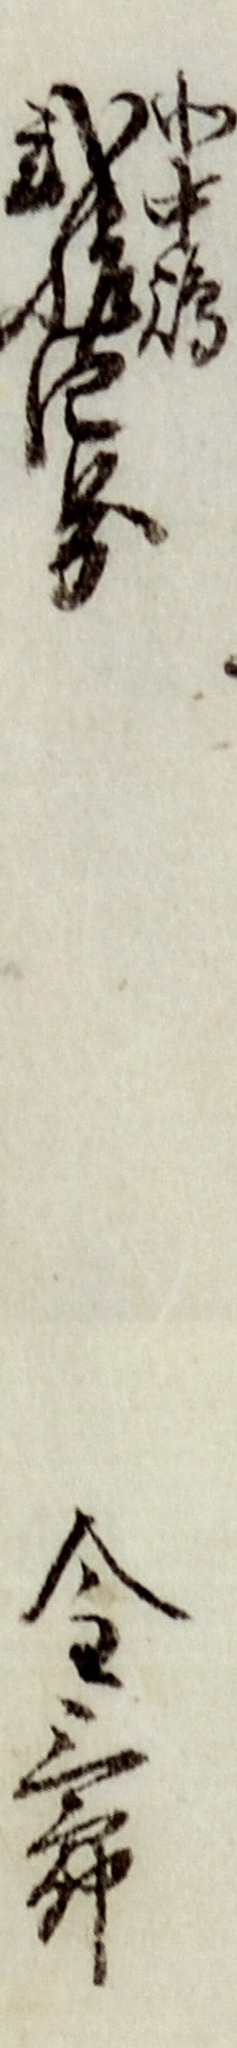弐拾四歩金三郎
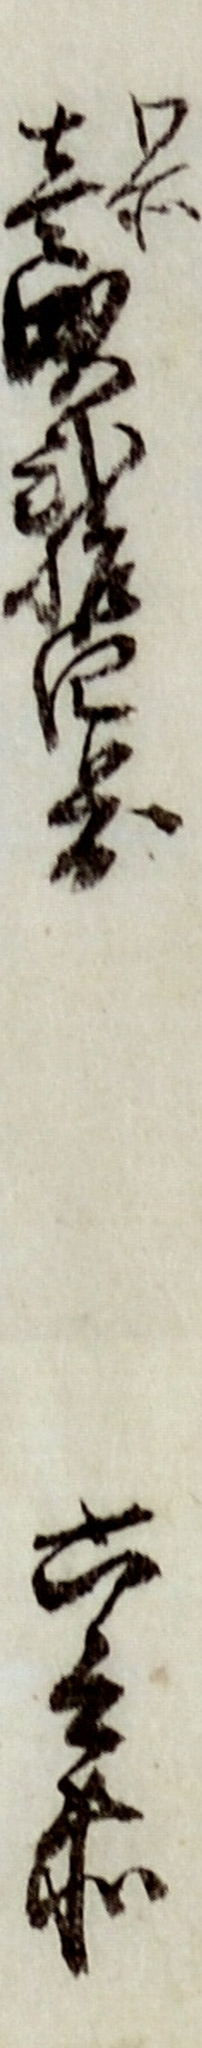壱畝弐拾四歩六兵衛

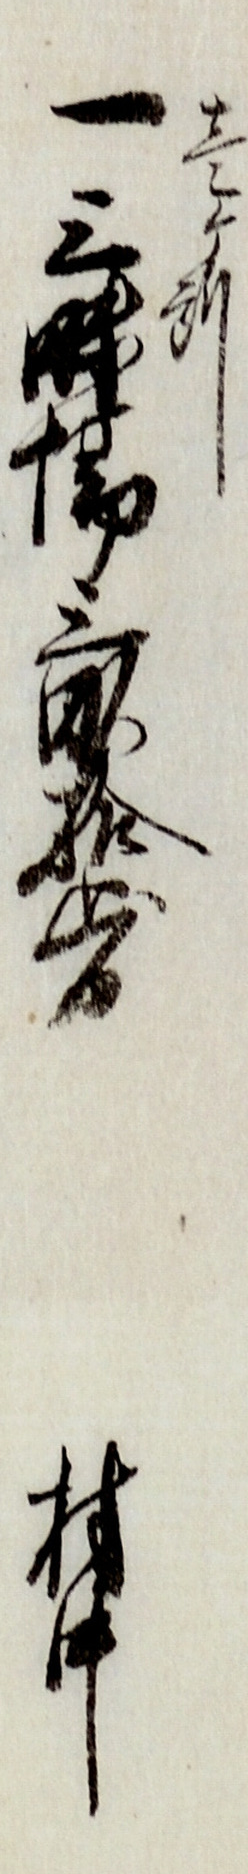一三昧場三畝拾歩村中
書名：御領分中山林社地手控
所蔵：伊那市立高遠町図書館・合同会社AMANE
